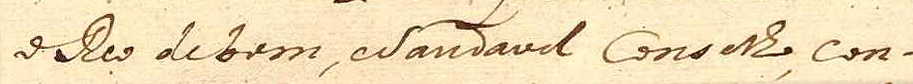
o Reo de bom, e Saudavel Conselho, con
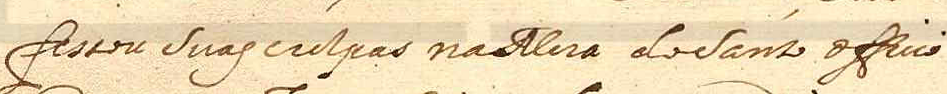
fessou suas culpas na Meza do Santo officio
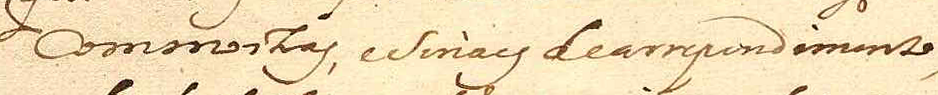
Com mostras, e sinaes de arrependimento,
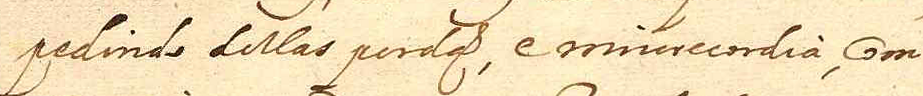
pedindo dellas perdaõ, e mizericordia, com
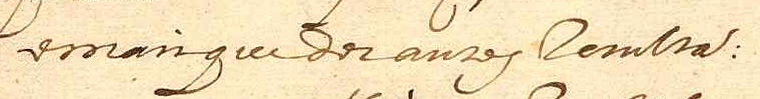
o mais que dos autos Resulta:
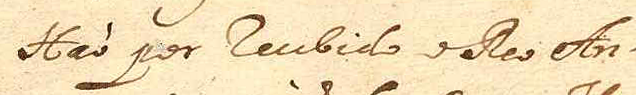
Haõ por Recebido o Reo An
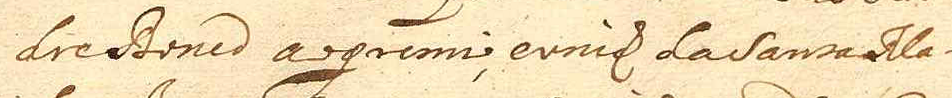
dre Boned ao gremio, e vniaõ da Santa Ma
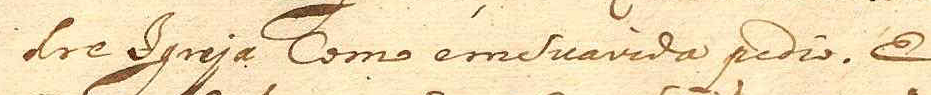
dre Igreja Como em sua vida pedio. E
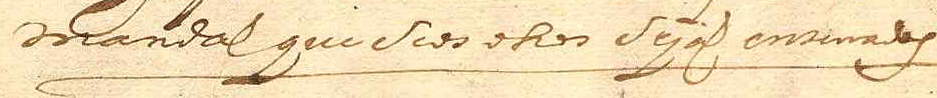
mandaõ que seos ossos sejaõ enterrados
